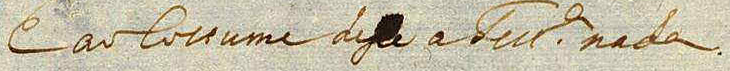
E ao Costume disse a Test.a nada
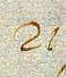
21
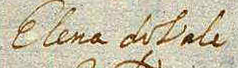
Elena do Vale
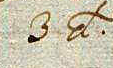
3 d̄.
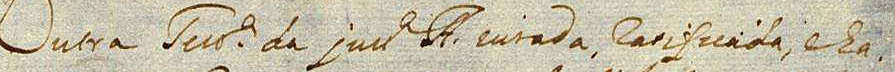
Outra Test.a da just.a A. iurada, Ratificada, e ha
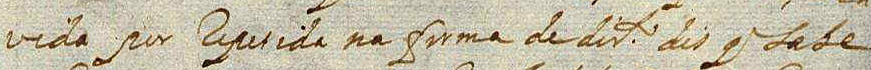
vida per Repetida na forma de dirt.o dis q̄ sabe
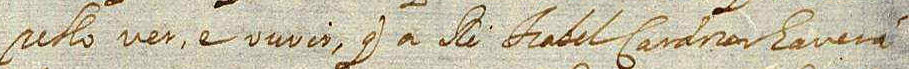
pello uer, e ouvir, q̄ a Ré Izabel Cardoza haverá
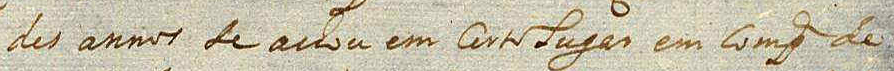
des annos se achou em certo Lugar em comp.a de
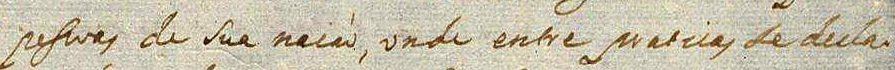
pessoas de sua naçaõ, onde entre praticas se decla
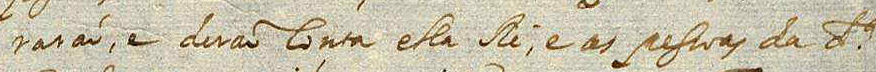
raraõ, e deraõ Conta ella Ré, e as pessoas da d̄.a
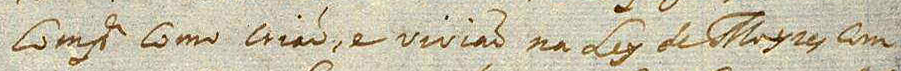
Comp.a como criaõ, e viviaõ na Ley de Moyzes com
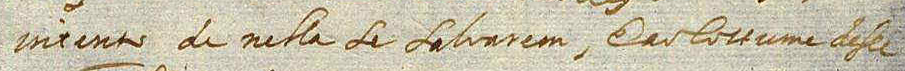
intento de nella se salvarem, E ao Costume disse
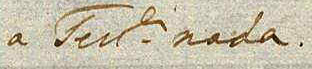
a Test.a nada.
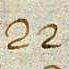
22
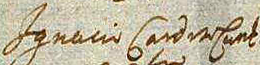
Jgnacio Cardozo Cunh.
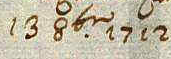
13 8.bro 1712
